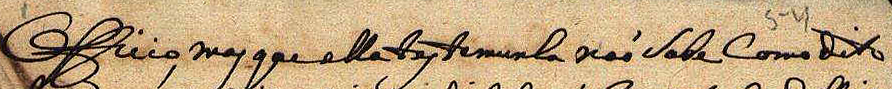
Officio, mas que ella testemunha naõ sabe Como dito
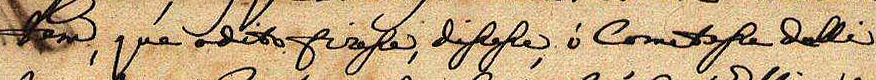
tem, que o dito fizesse, dissesse, ó Cometesse delli
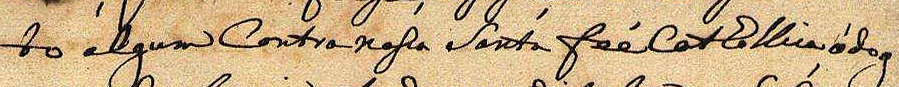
to algum Contra nossa Santa feé Cathollica, ó dog
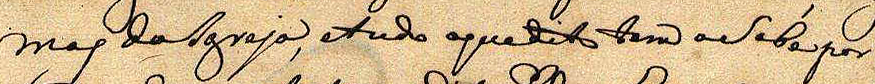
mas da Igreja, e tudo o que dito tem o sabe por
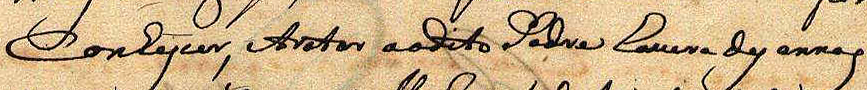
Conhescer, e tratar ao dito Padre hauera des annos
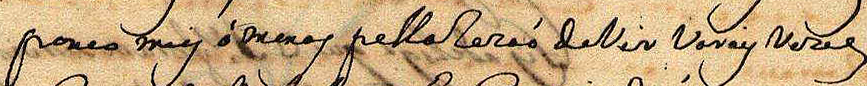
pouco mais ó menos pella Rezaõ de Vir Varais Vezes
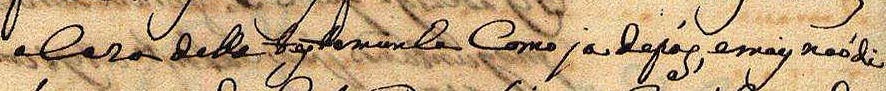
a Caza della testemunha Como ja depós, e mais naõ di
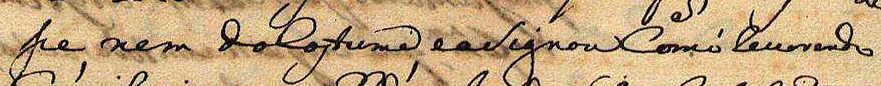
se, nem do Costume, e aSignou Com ó Reuerendo
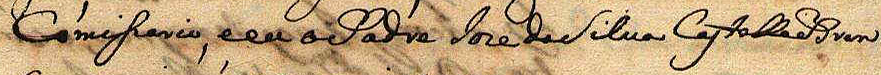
Comissario, e eu o Padre Ioze de Silua Castello Bran
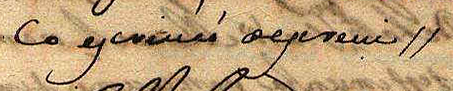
Co escriuaõ o escreui //
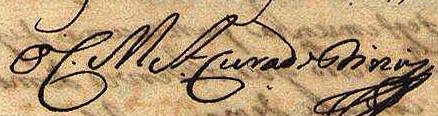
O C. Mel Curado Dinis
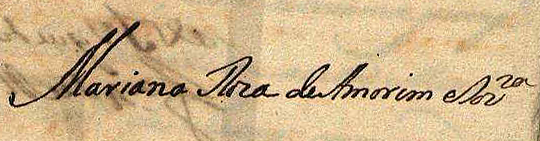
Mariana Roza de Amorim e Souza
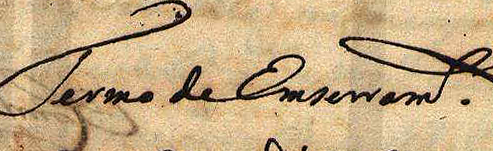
Termo de Emserram.to
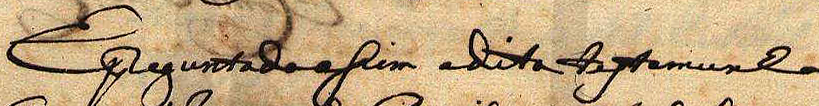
E pReguntada assim a dita testemunha
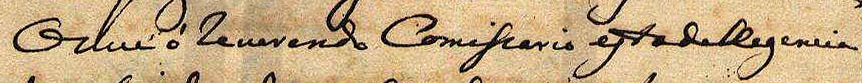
Ouue o Reuerendo Comissario esta dellegencia
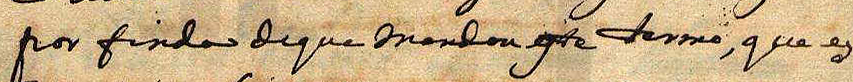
por finda de que mandou este termo, que es
